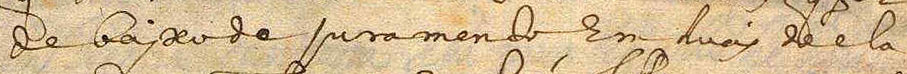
debaixo de Juramento Em huās decla
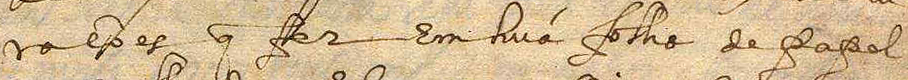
racões q̄ fez Em huā folha de papel
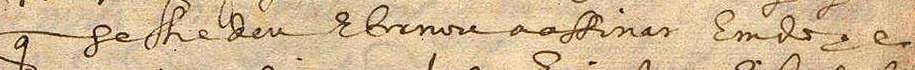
q̄ se lhe deu E tornou a assinar Em doze
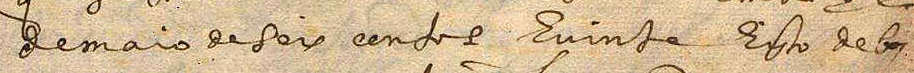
de maio de seiscentos E uinte E isto debaj
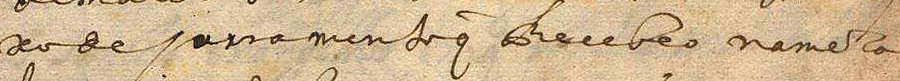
xo de juramento q̄ Recebeo na meza
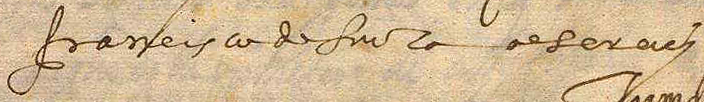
francisco de souza o escreuj
